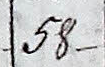58
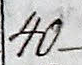40
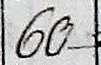60
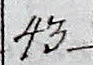43
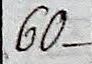60
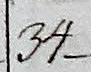34
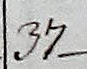37
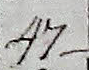47
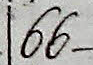66
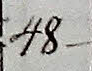48
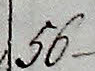56
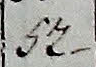52
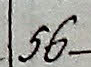56
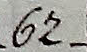62
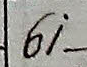61
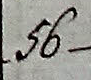56
